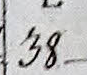38
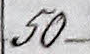50
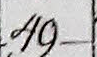49
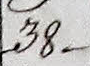38
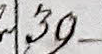39
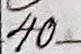40
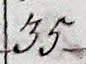35
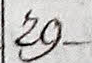29
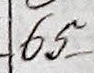65
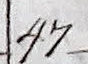47
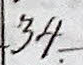34
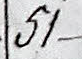51
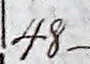48
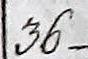36
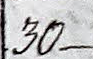30
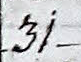31
